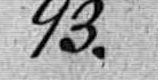93.
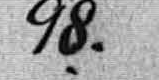98.
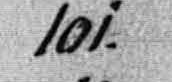101.
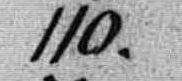110.
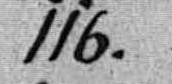116.
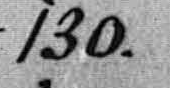130.
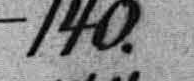140.
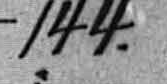144.
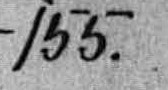155.
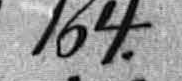164.
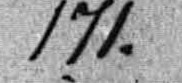171.
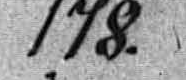178.
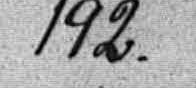192.
